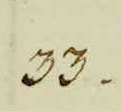33
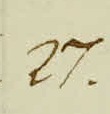27
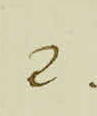2
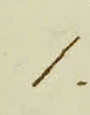1
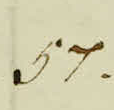57
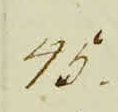45
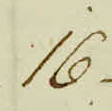16
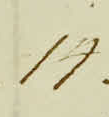14
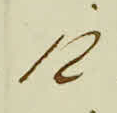12
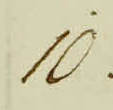10
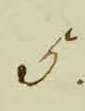5
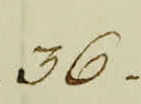36
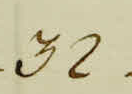32
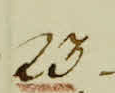23
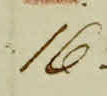16
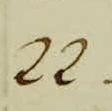22
